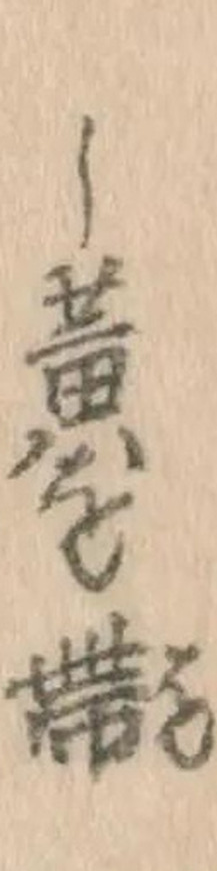し黄を帯
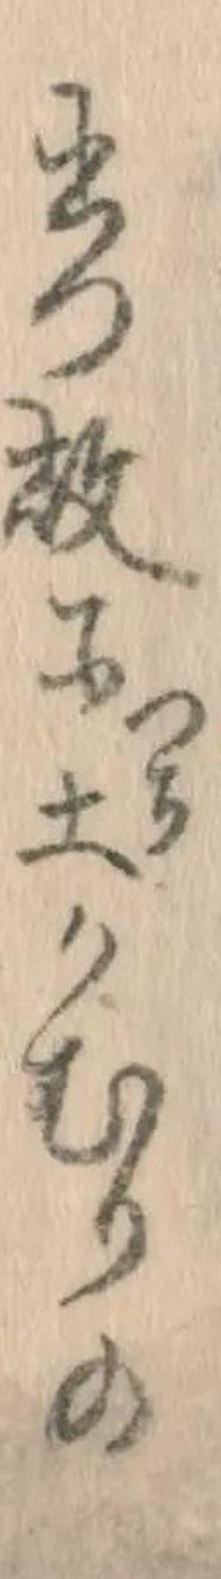出つ故に土かむりの
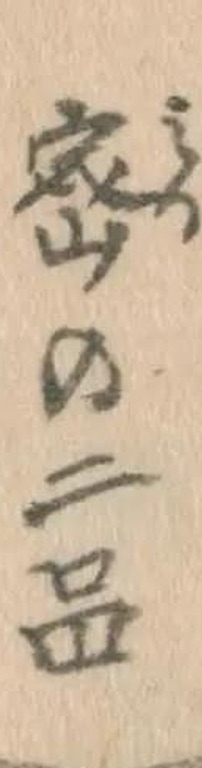密の二品
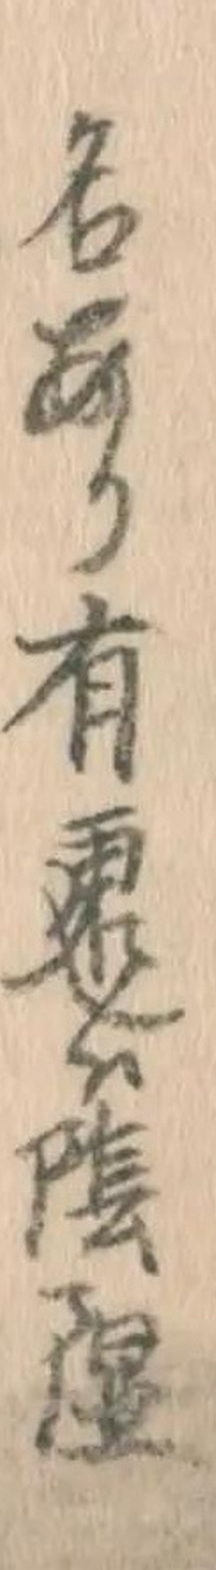名あり有処は陰湿
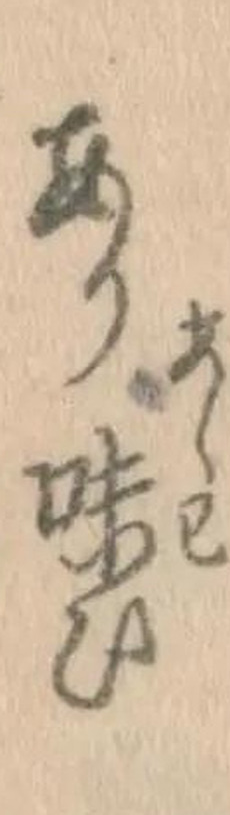あり味ひ
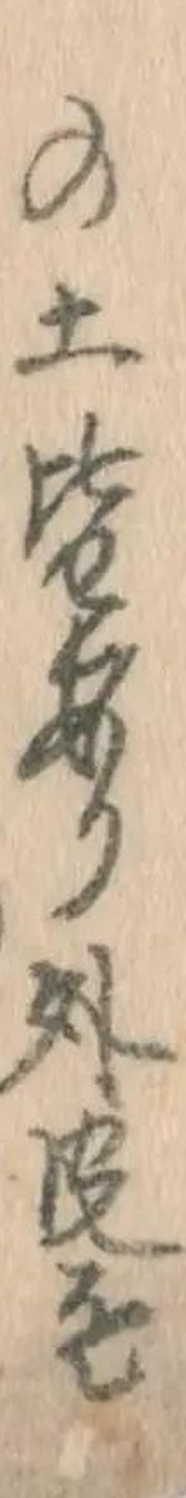の土皆あり外皮を
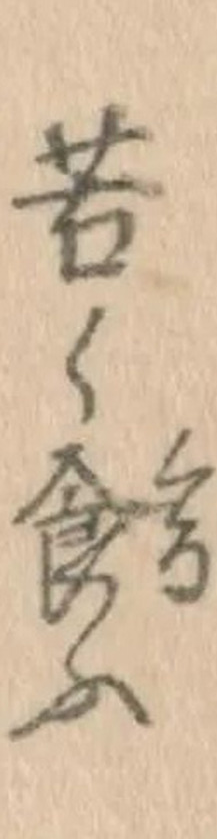苦く食ふ
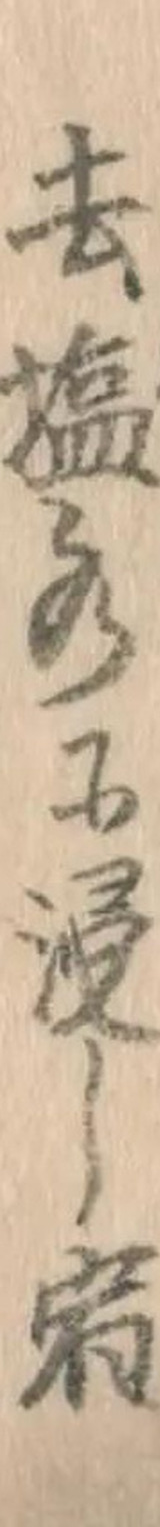去塩水に浸し宿
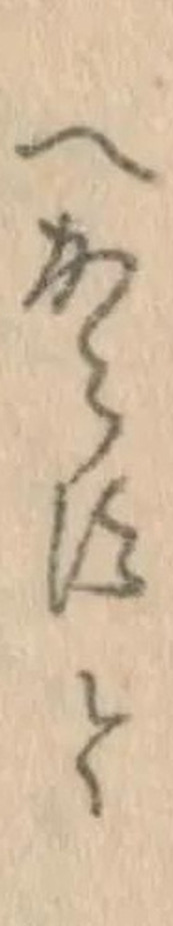へからすと
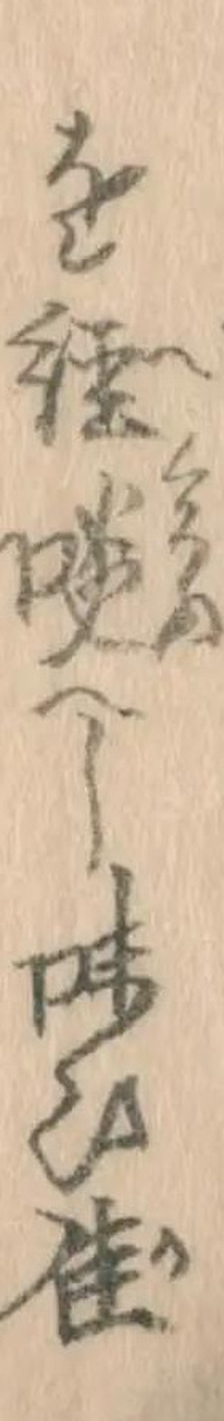を経啖へし味ひ佳
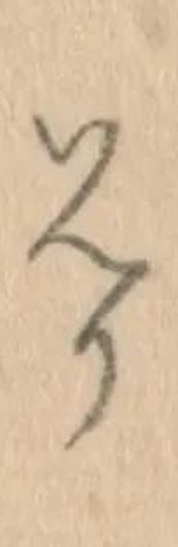いへり

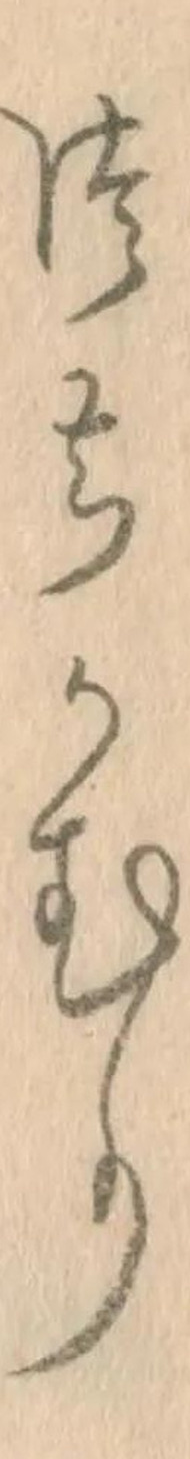つちかむり
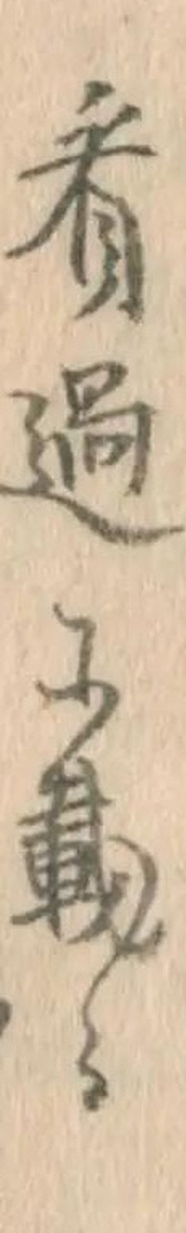看過に載る
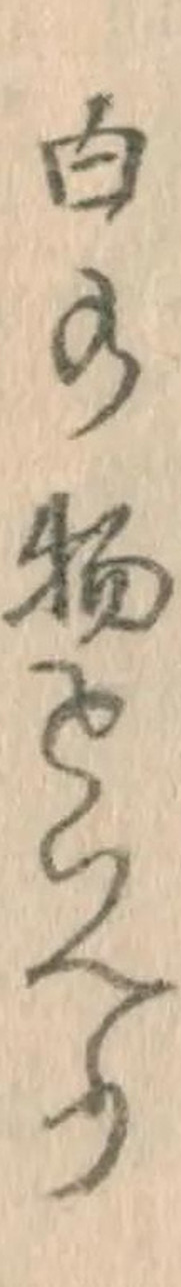白の物といへり
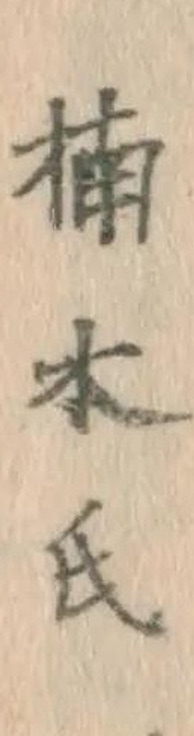楠本氏

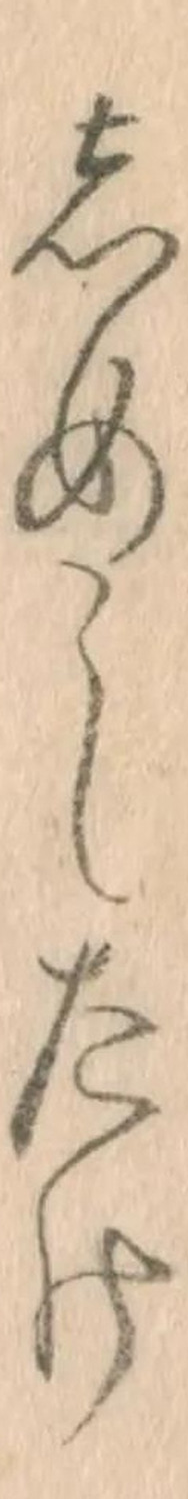しめしたけ
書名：本草図譜. 巻55-57
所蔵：国立国会図書館 National Diet Library, JAPAN
